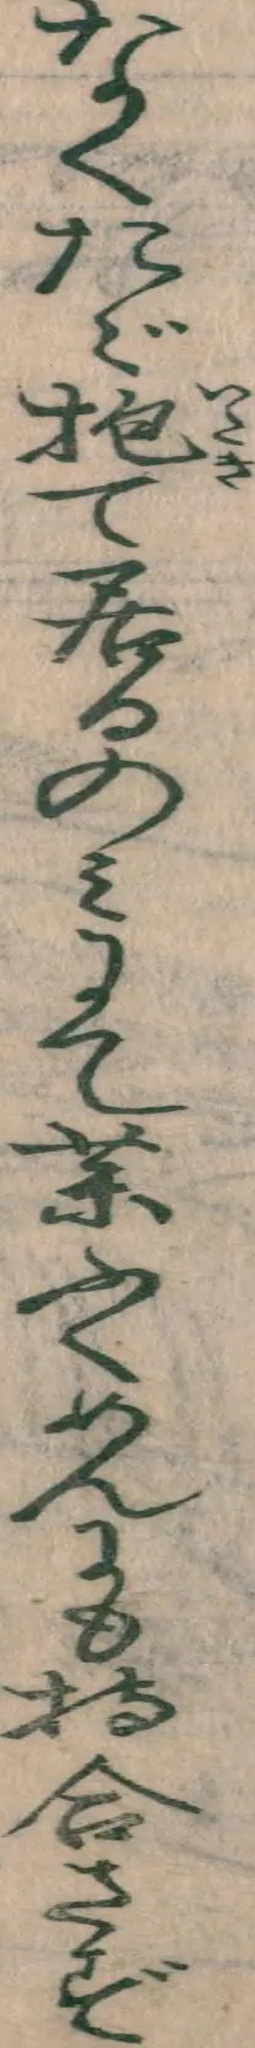なくたゞ抱て居るのみにて薬ふくめんにも持合さず
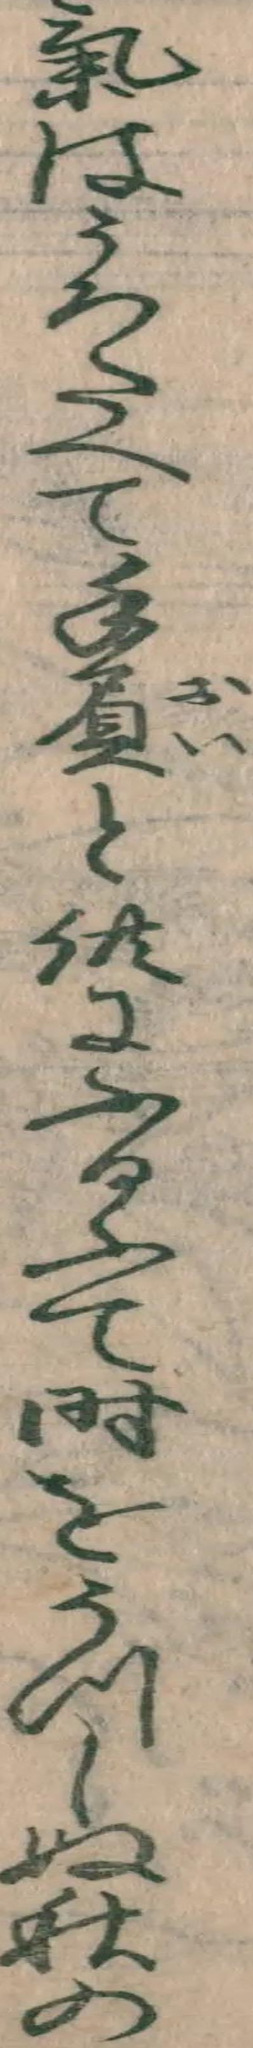気はうろたへて手負と供にふるふて時をうつしぬ秋の
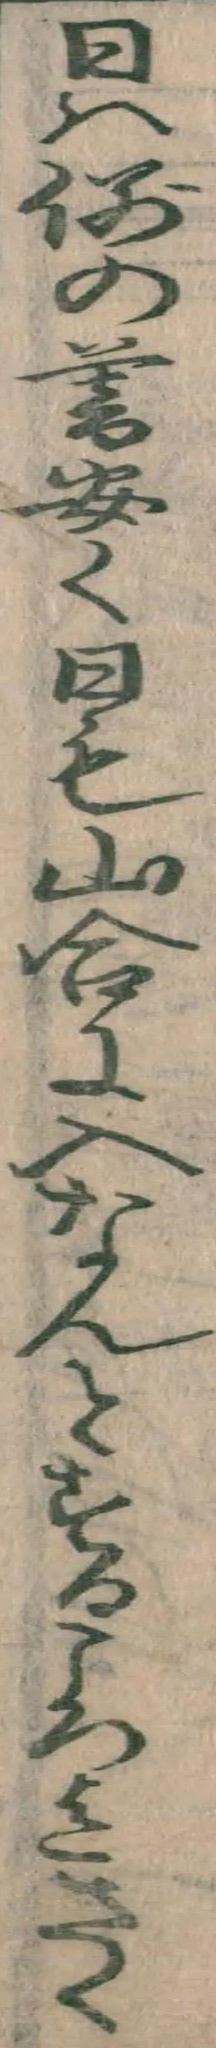日は例の暮安く日も山合に入なんとするころ迄さく
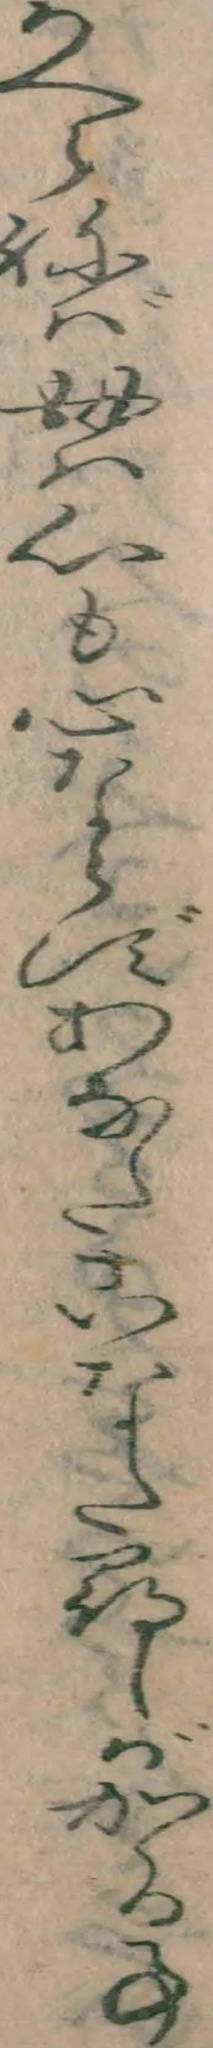かへらねば母は心も心ならずあなたこなた尋しがかゝる事
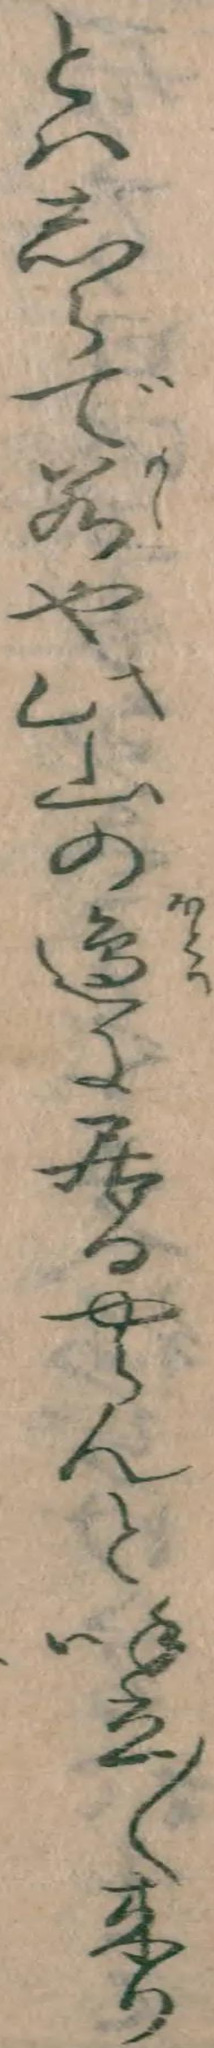とはしらで若や此山の辺に居るやらんと呼立〳〵来り
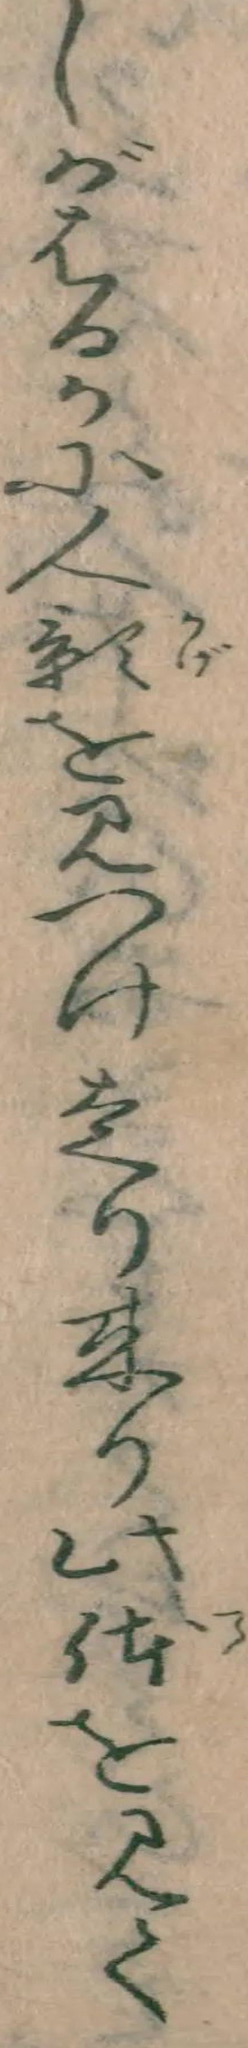しがはるかに人影を見つけ走り来り此体を見て
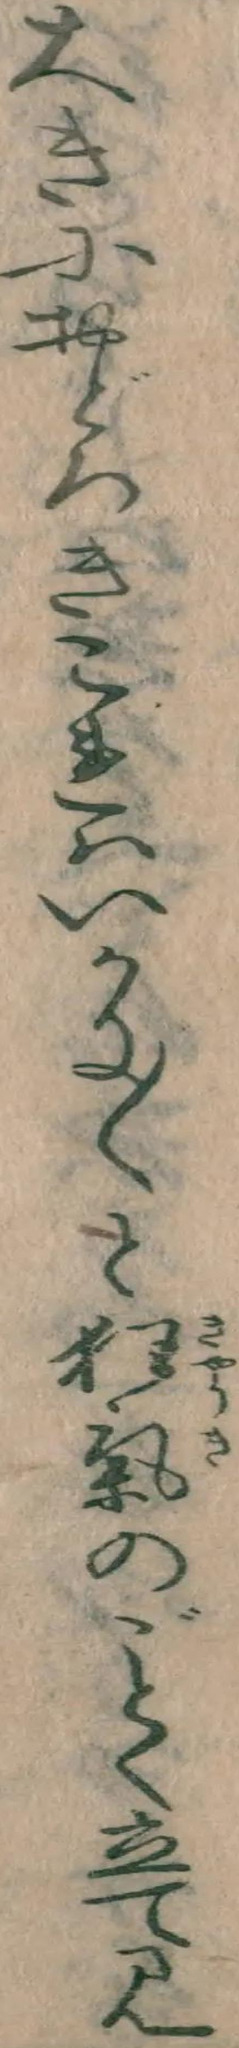大きにおどろきこれはいかに〳〵と狂気のごとく立て見
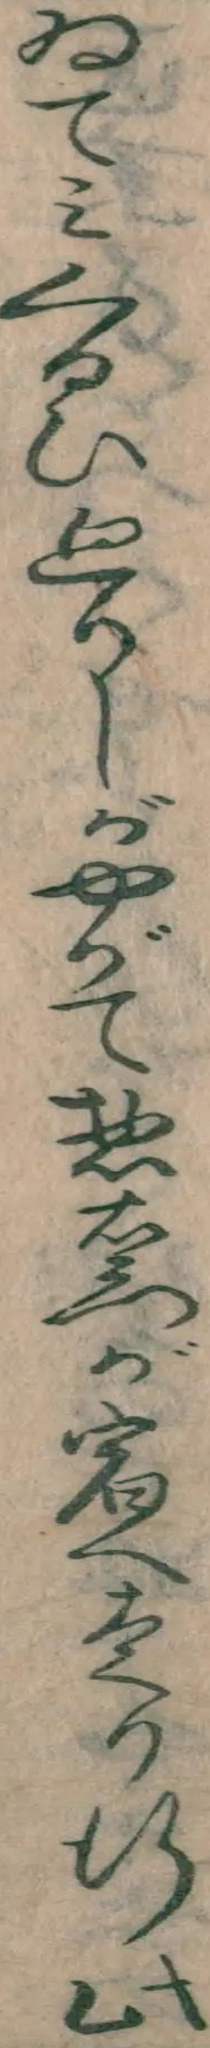ゐてみくるひ廻りしがやがて惣右衛門が宿へ走り行此
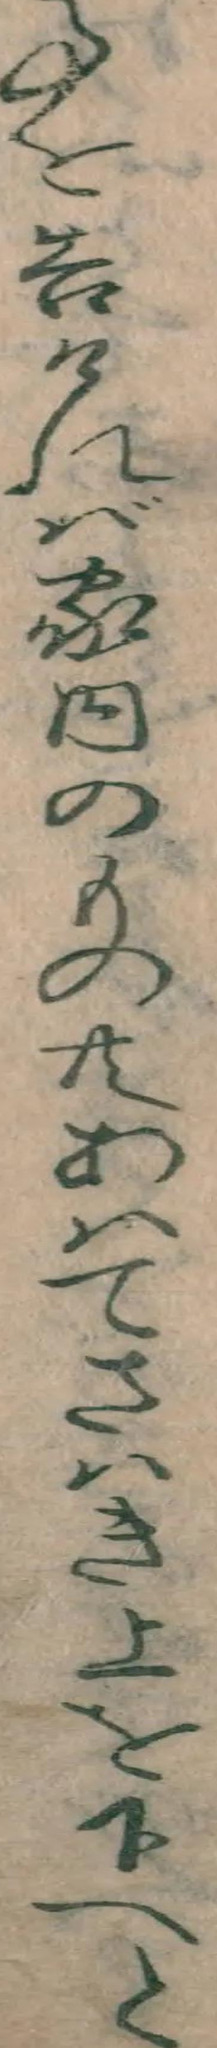事を告ければ家内のもの共あはてさはき上を下へと
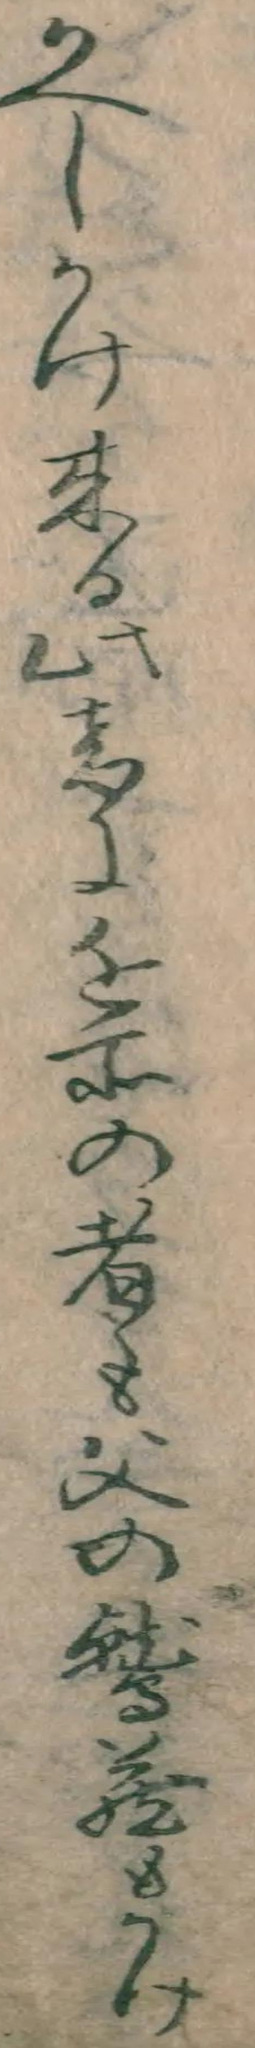かへしかけ来る此音に近所の者も父の鷲蔵もかけ
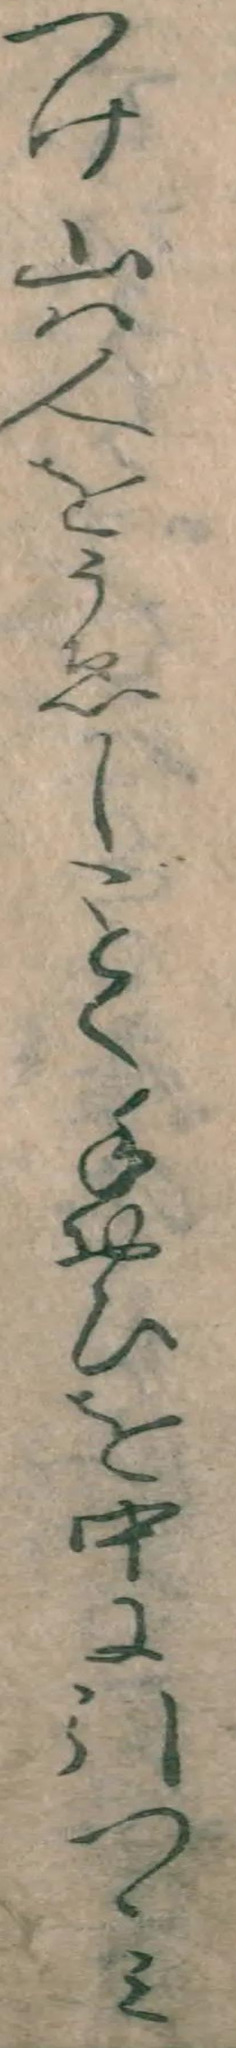つけ山は人をうゑしごとく手おひを中に引つゝみ
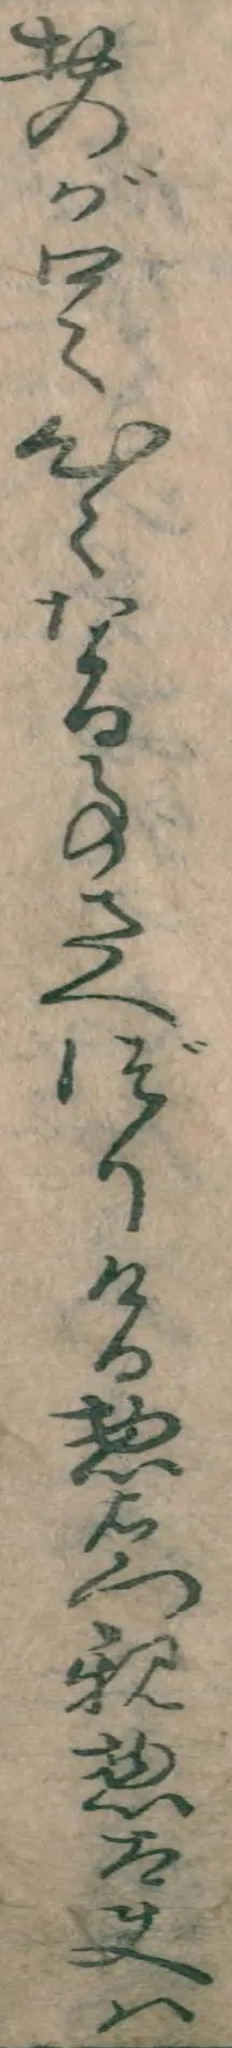おのが口々心々なる事さへづりける惣右衛門親惣太夫は
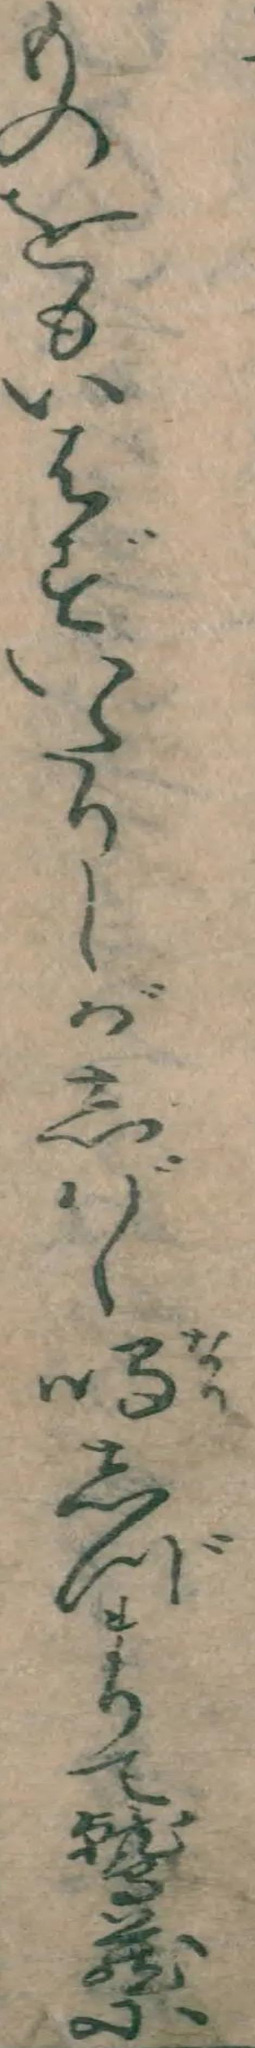ものをもいはずいたりしがしばし鳴しづまりて鷲蔵に

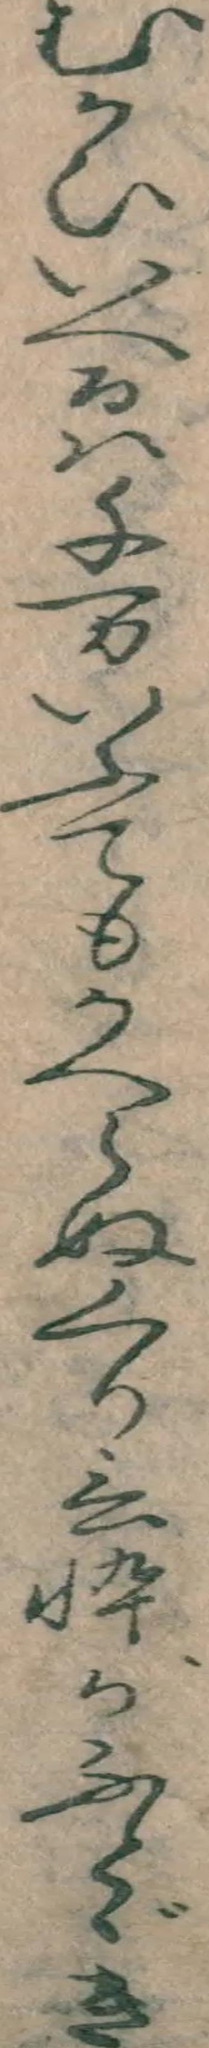むかひいへるは千万いふてもかへらぬくり言忰がふとゞき
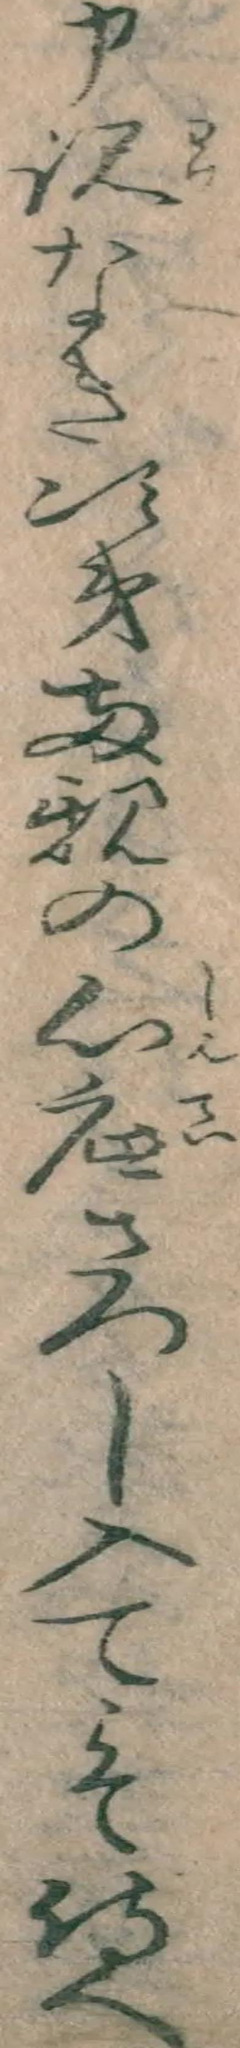申訳なき次第両親の心底さつし入てこそ侍へ
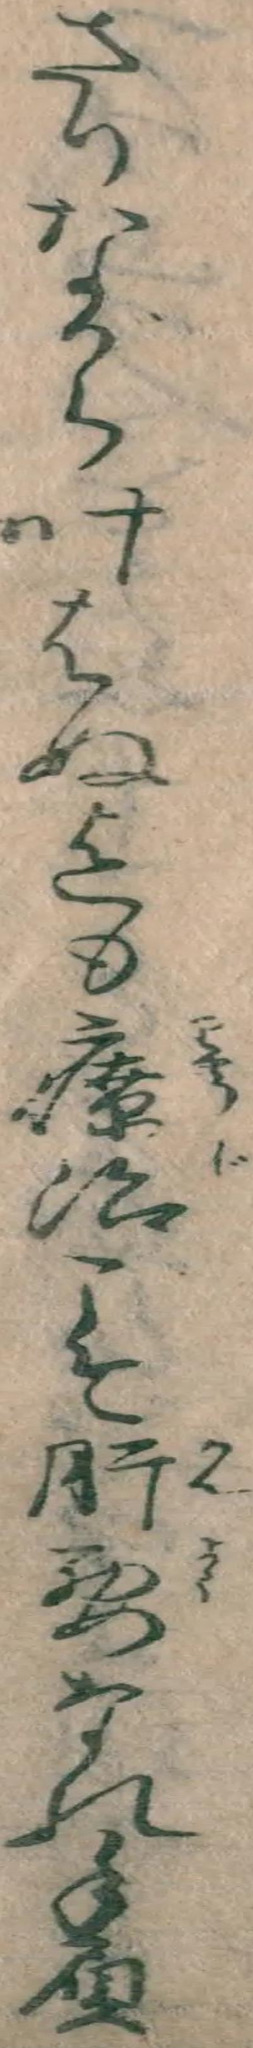さりながら叶はぬ迄も療治こそ肝要なれ手負
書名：怪談御伽童 5巻. [1]
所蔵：国立国会図書館 National Diet Library, JAPAN
